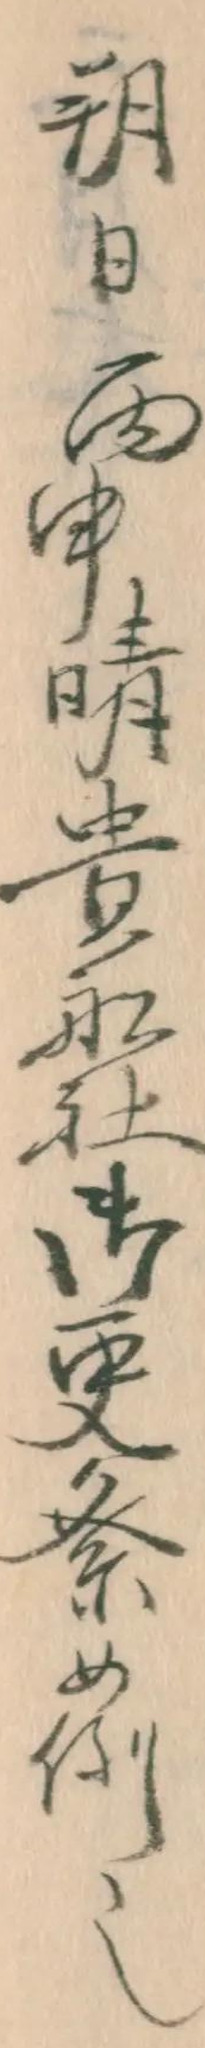朔日丙申晴貴舩社御更祭如例也
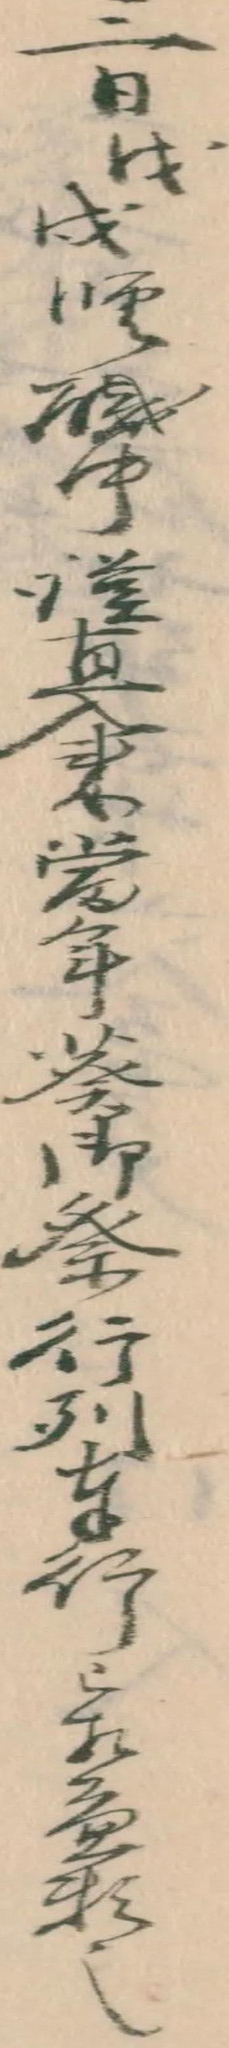三日戊戌曇職中謹直入来當年葵御祭行列奉行被相兼頼也
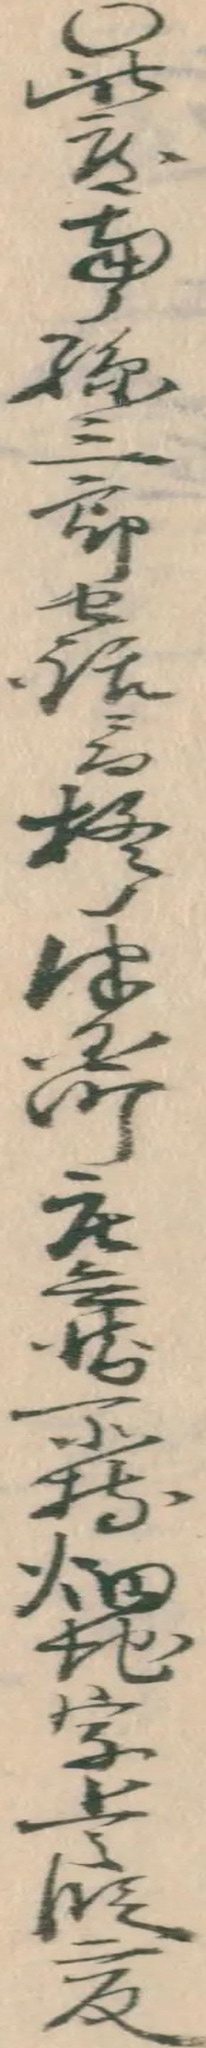〇此度南孫三郎世話ニ而柊ノ津国町庄兵衛所持畑地字上之段二反
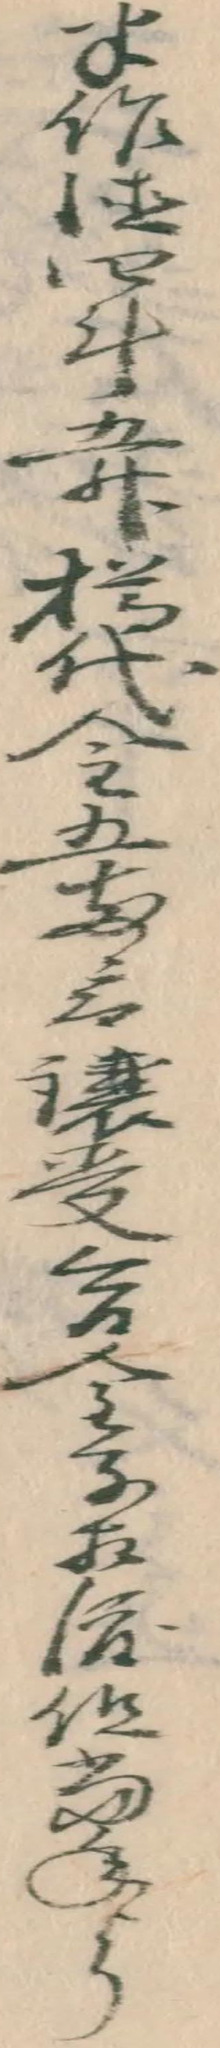半作徳四斗五升樽代金五両ニ而譲受今日金子相渡但當年より
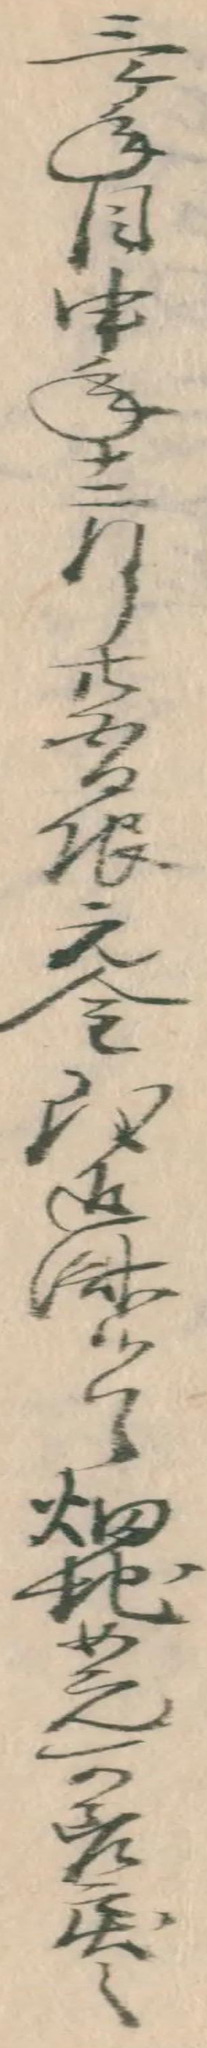三ヶ年目申年十二月廿五日限元金致返済候ハヽ畑地如元可差戻之
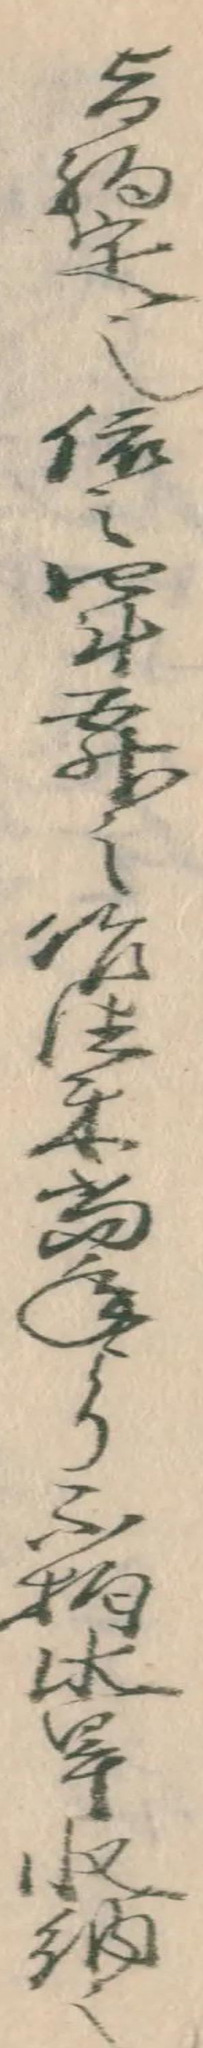旨約定也依之四斗五升之作往米當年より不拘水旱収納也
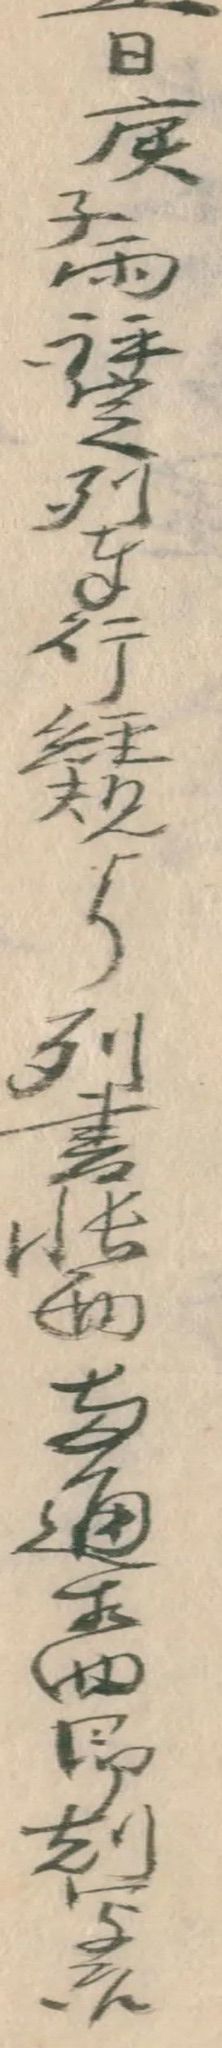五日庚子雨評定列奉行経規より列書帳面両通相回即刻写取
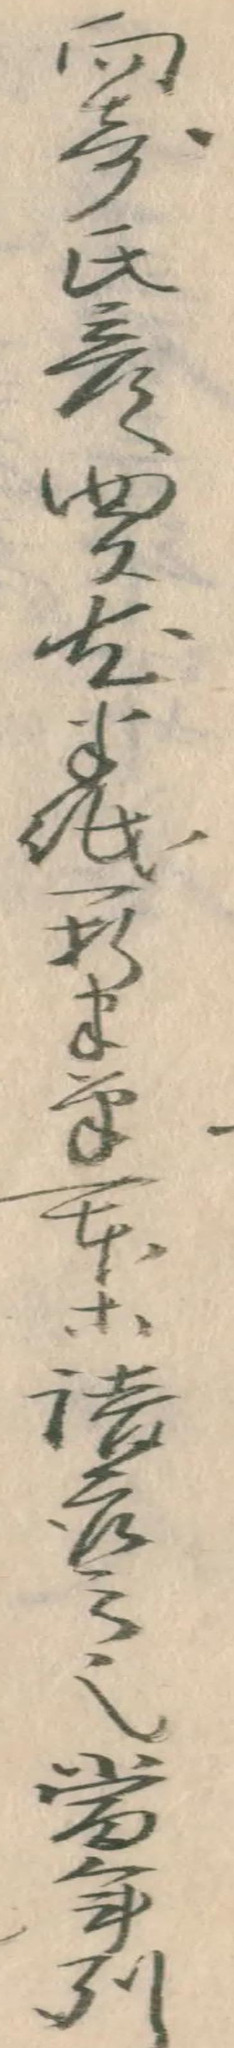向寄氏彦へ回ス尤半紙一折半筆一本等請取之也當年列
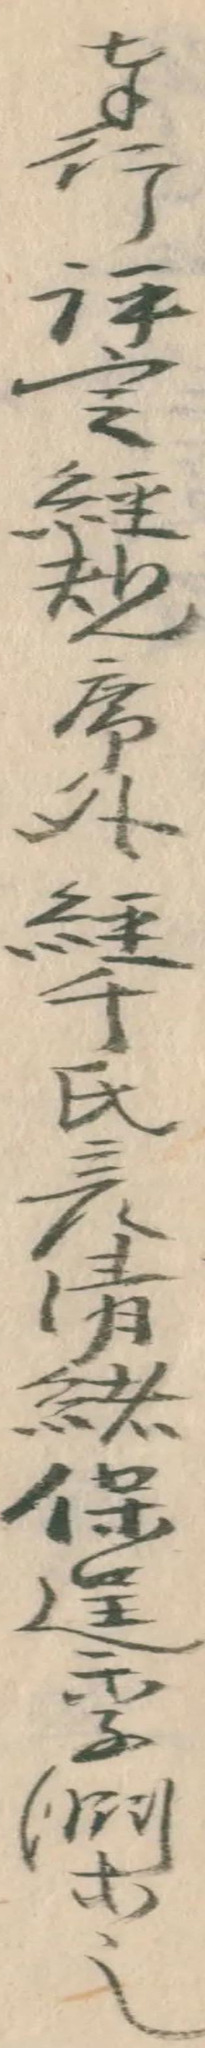奉行評定経規席外経千氏彦清緒保逞季淵等也
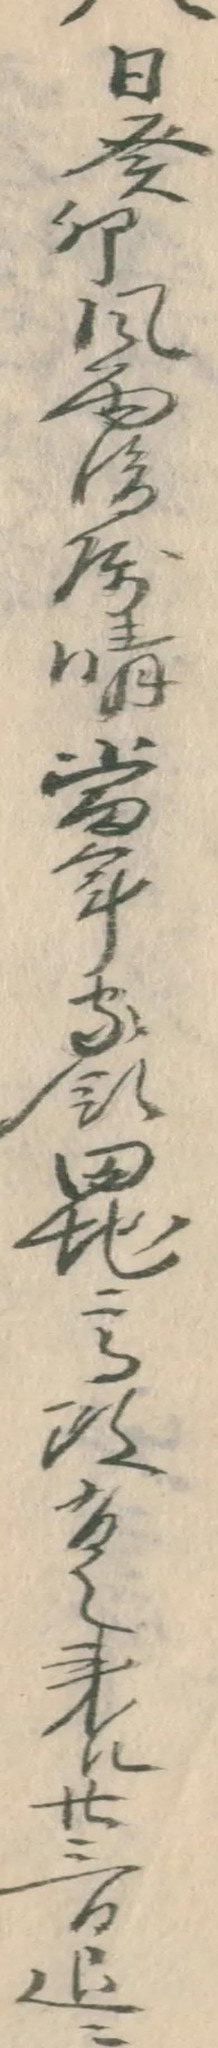八日癸卯風雨後属晴當年家領田地高改有之来ル廿三日迄ニ
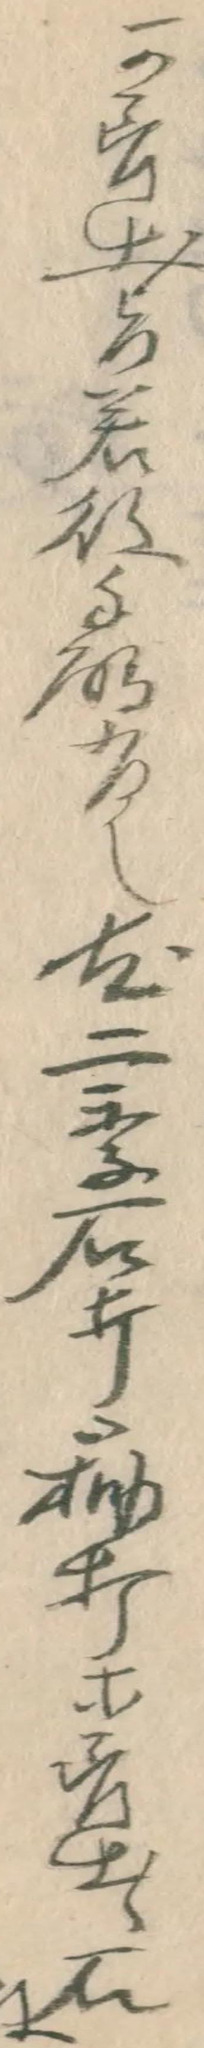可差出旨若役手觸有之尤二季石打御棚打等差出候石数
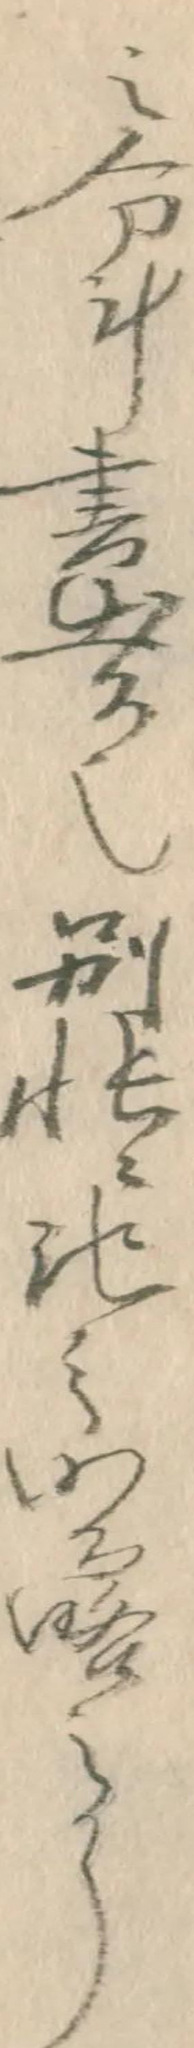之分斗書出候也別帳ニ記之仍而略之了
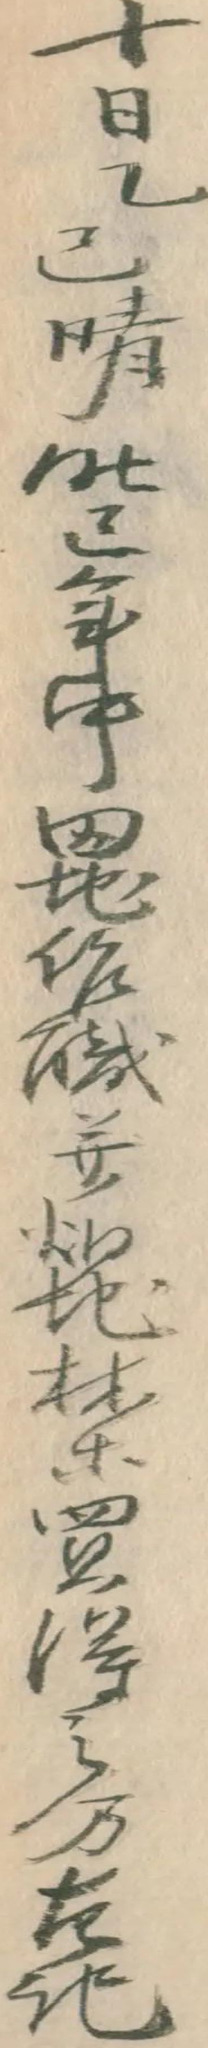十日乙巳晴昨巳年中田地作職并畑地林等買得之分左記

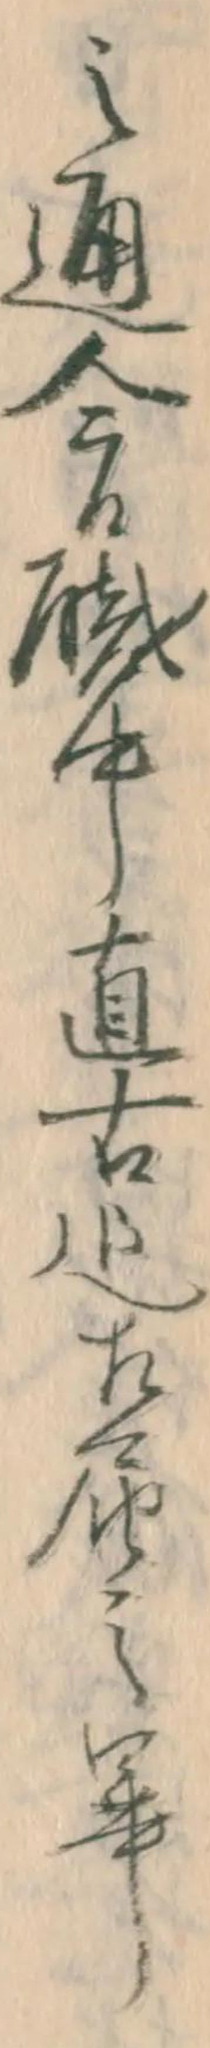之通今日職中直古迄相届之畢
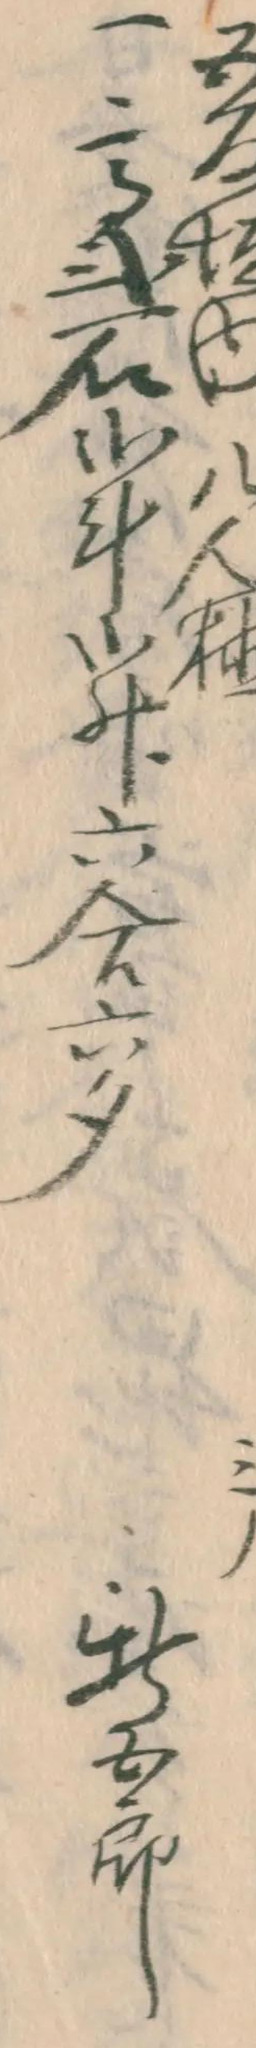一高弐石弐斗弐升六合六夕三ノ新五郎
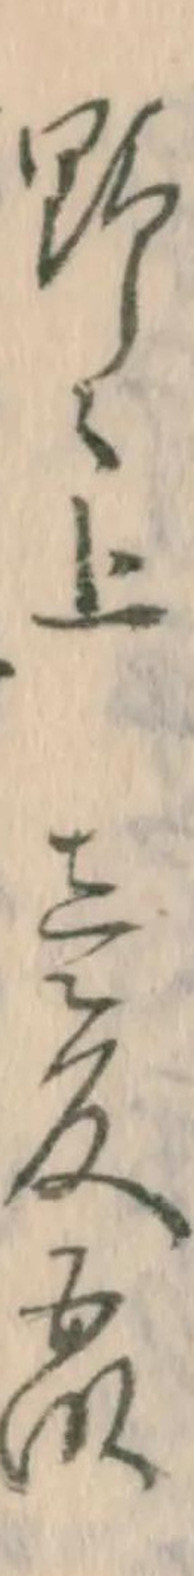野々上壱反五畝
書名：賀茂社記録. 第66冊
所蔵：国立国会図書館 National Diet Library, JAPAN
